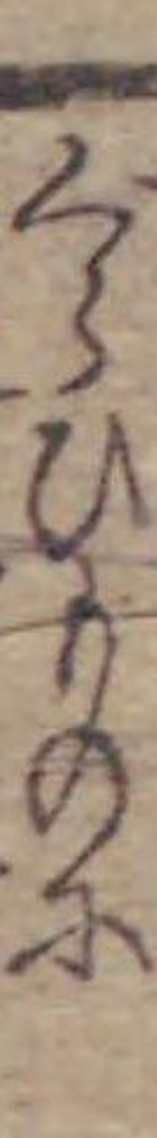くらいものに
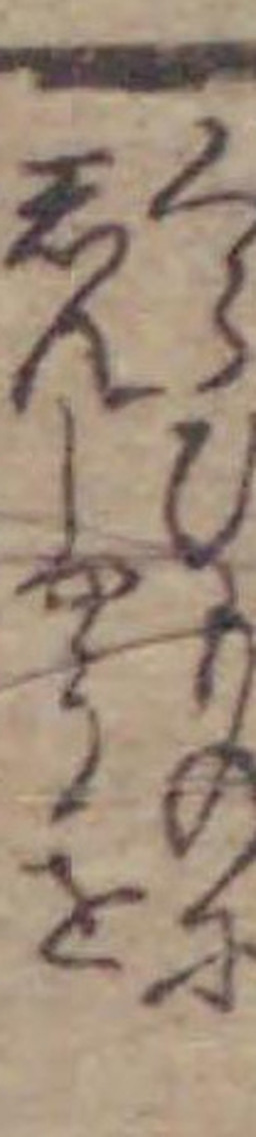しんしやうを
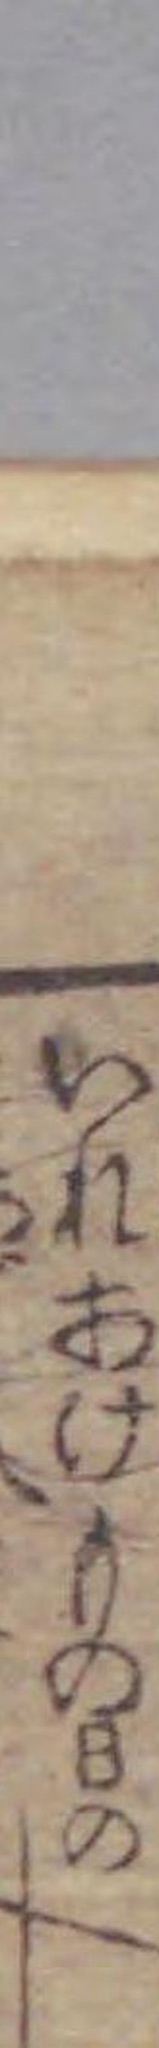いれあけもの日の
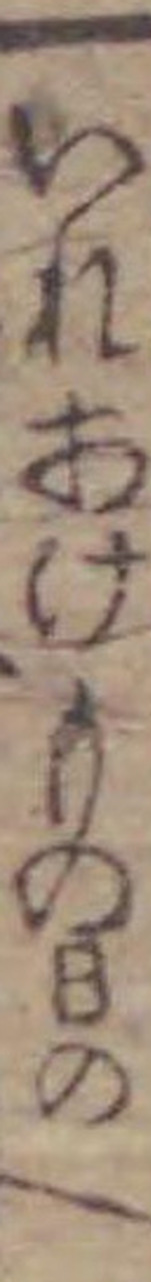いれあけもの日の
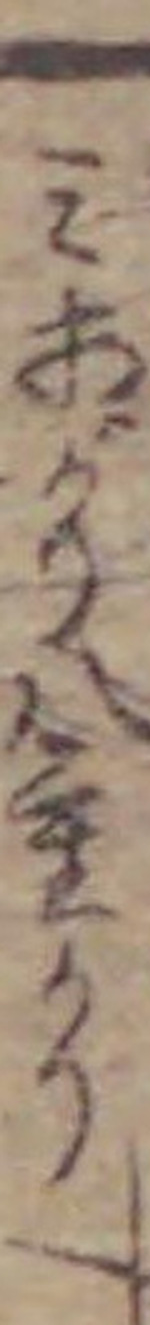みあがり八重かり
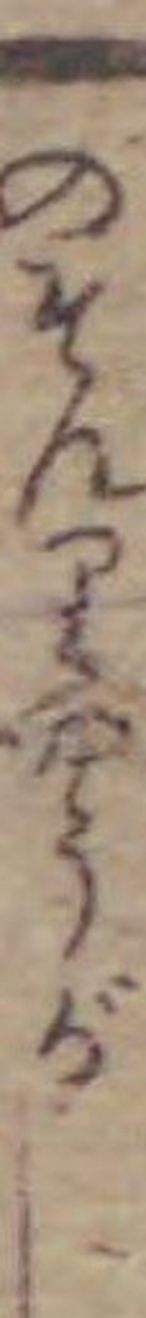のそんりやうが
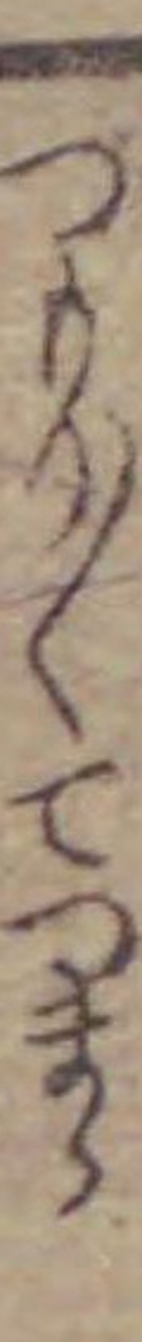つもり〳〵てつまら
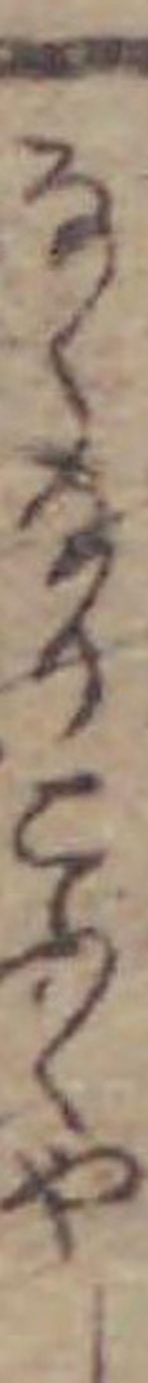なくなりこふくや
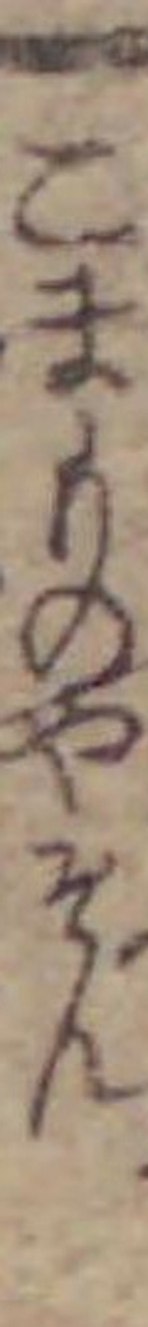こまものやそん
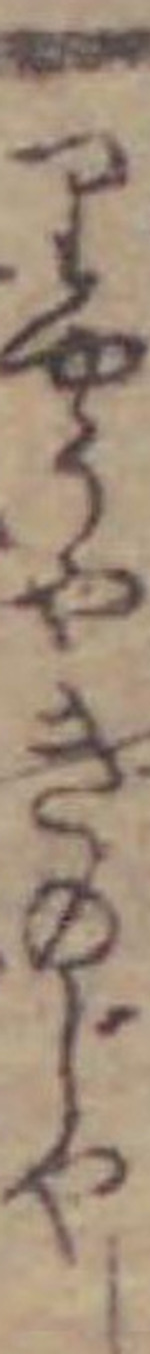りやうやきのじや
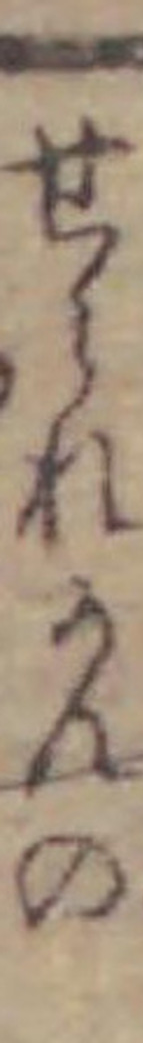せられかんの
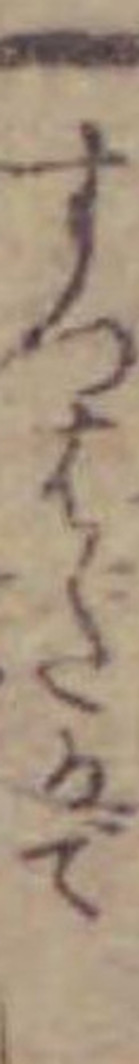すつはだかで
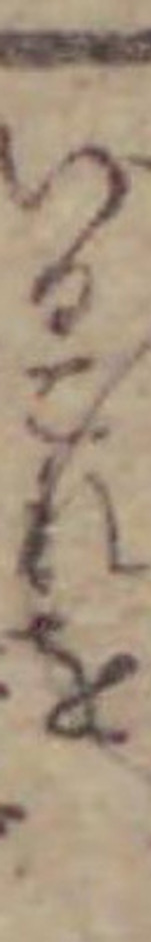いるこれを
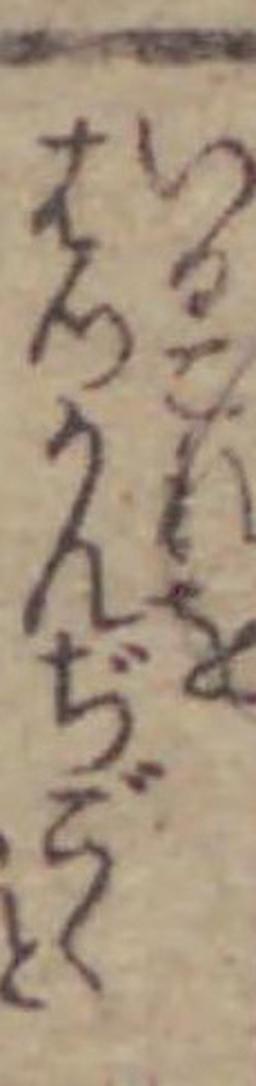はつかんぢごく
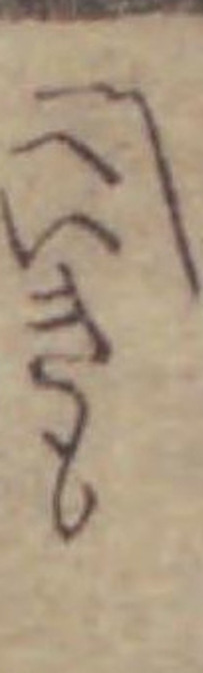「へいきも
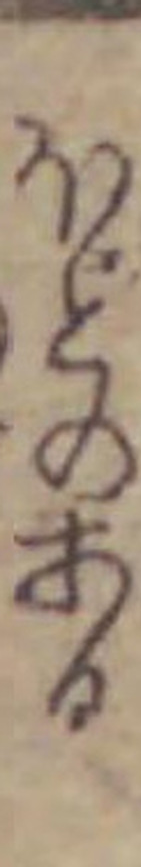ほどのある
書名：九替十年色地獄 : 3巻
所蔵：国立国会図書館 National Diet Library, JAPAN
